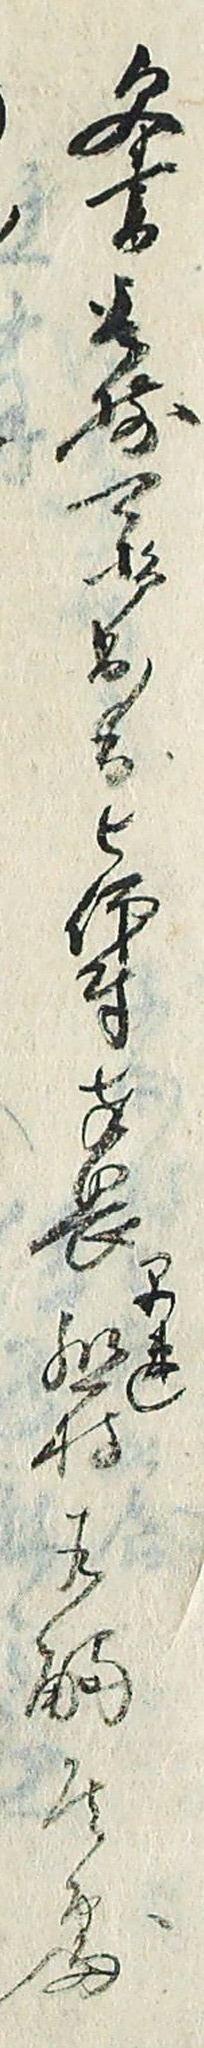受書取揃可指出旨被仰付奉畏早速組村相触候処
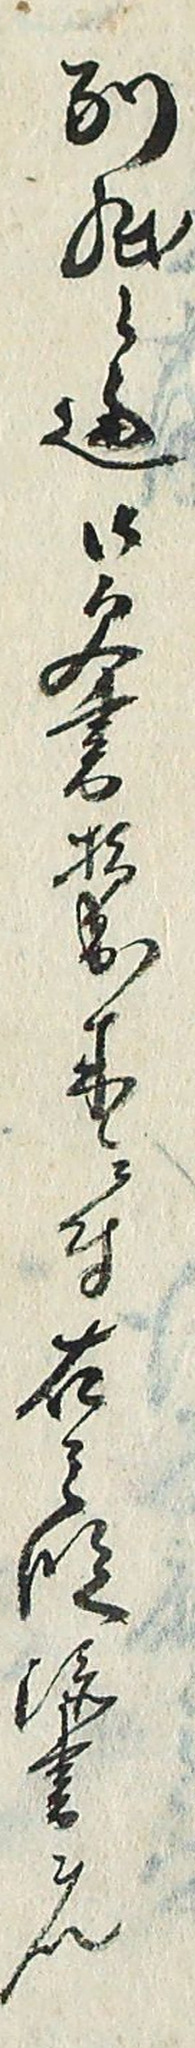別紙之通御受書指出来候に付右之段添書きを以
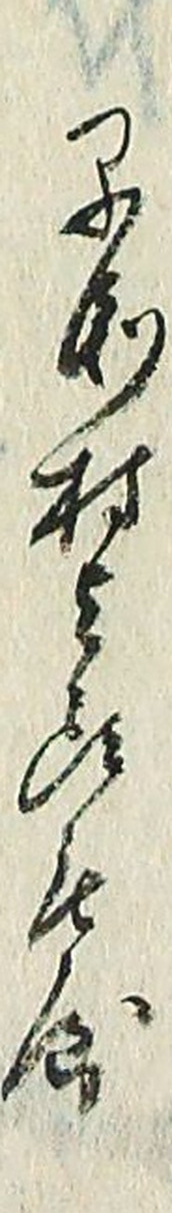早渕村与頭庄屋
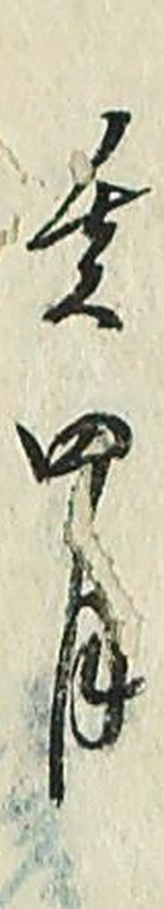亥四月
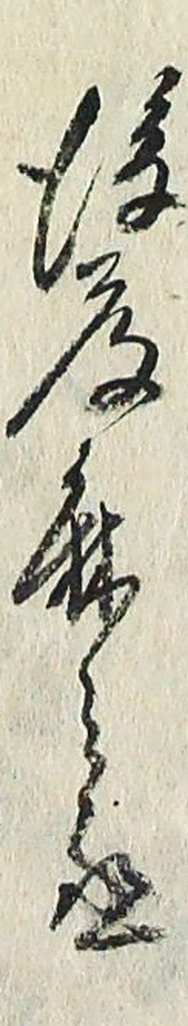後藤麻之丞
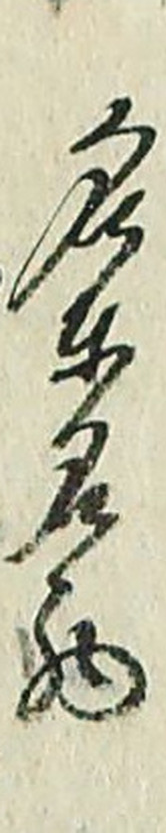名東名西
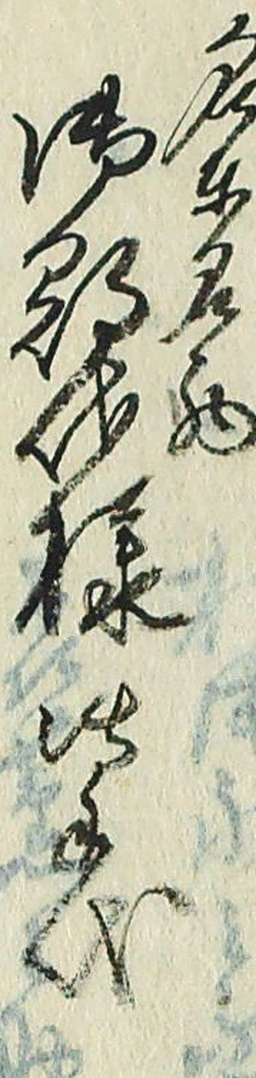御郡代様御手代
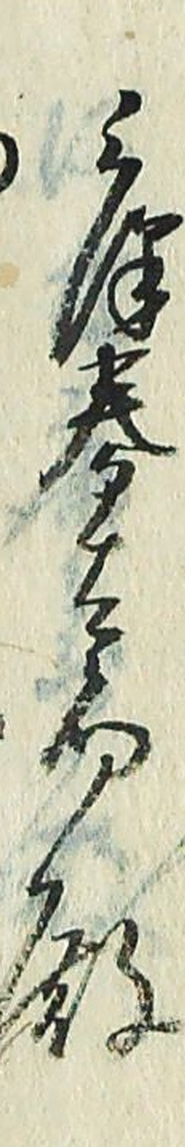三沢春太郎殿
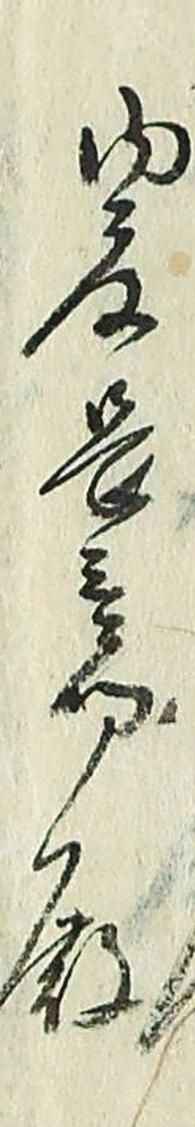内藤長三郎殿
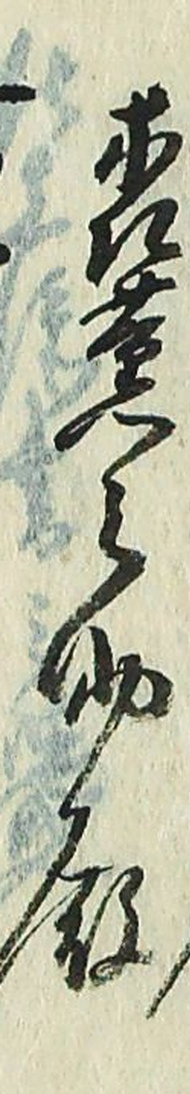森薫之助殿
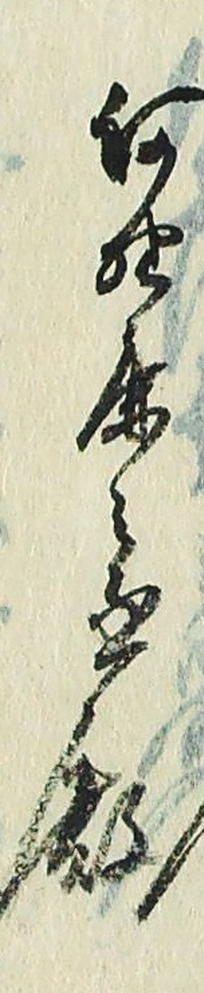河野鹿之丞殿
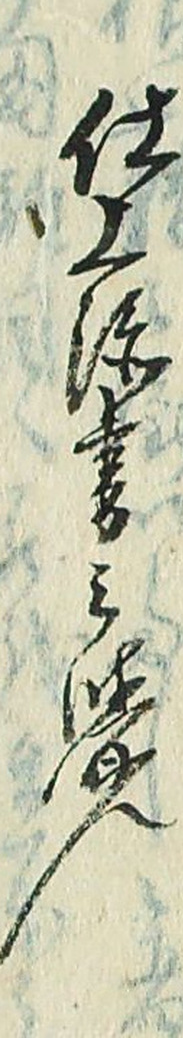仕上添書之覚
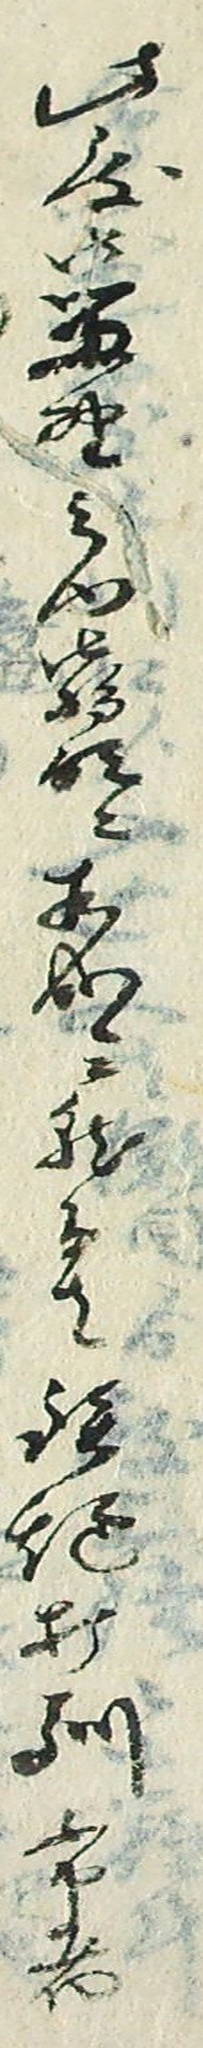此度御留野之内御指明に相成候に就而は鉄砲打馴不申者
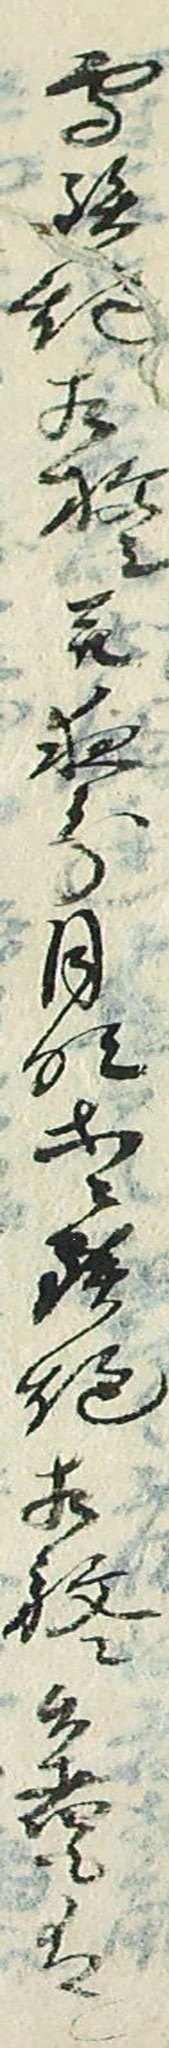専鉄砲相放し幷夜分月明等に鉄砲相放し候者も有
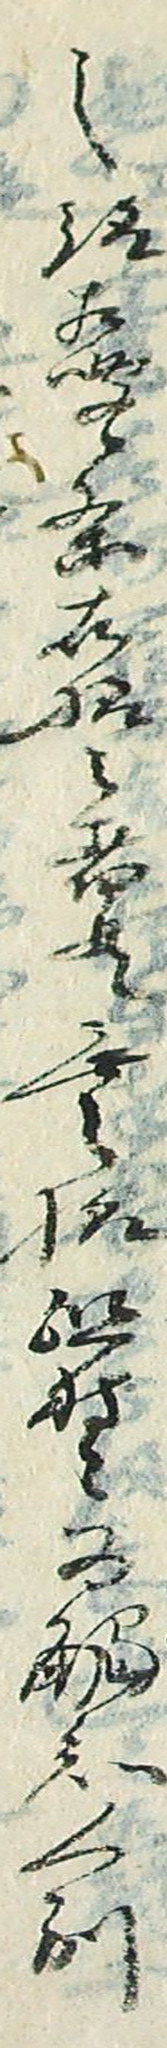之趣相聞候条右様之者共無之様組村々為触知人別
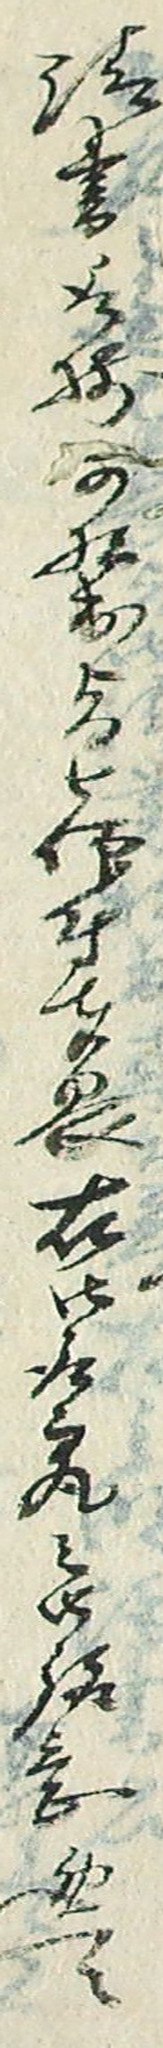請書取揃可指出旨被仰付奉畏右御取究之御趣意逸々
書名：諸御用御□受書控
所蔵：鳴門教育大学 Naruto University of Education
